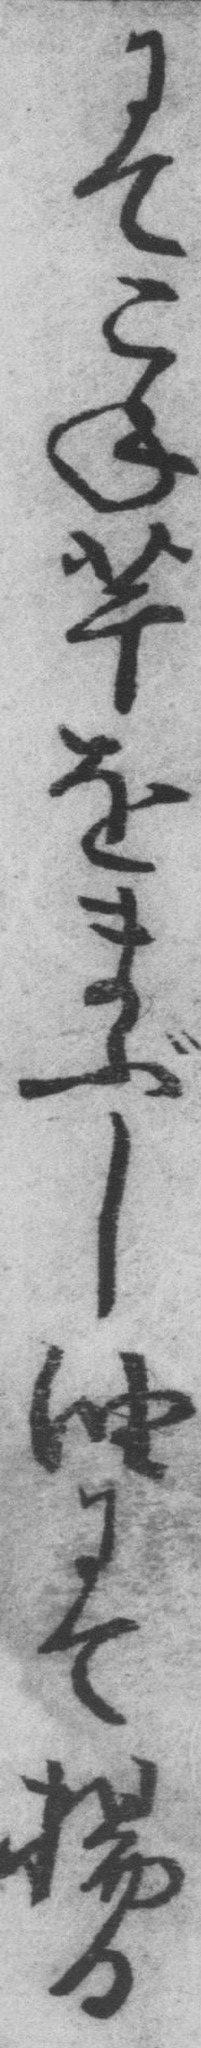にてこね芋をまぶし油にて揚る
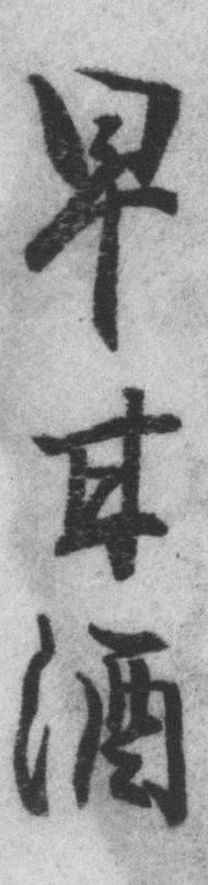早甘酒
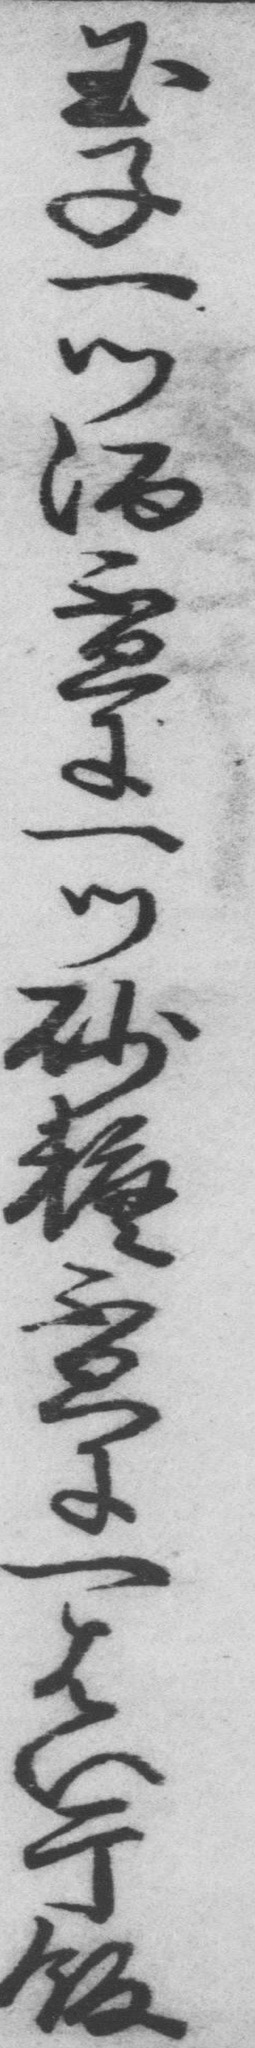玉子一ツ酒盃に一ツ砂糖盃に一はい干飯
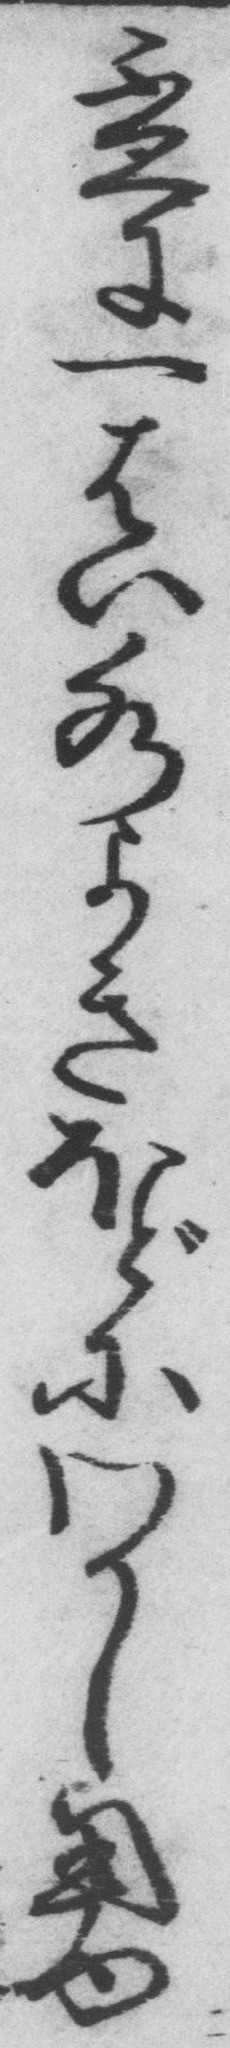盃に一はい水よきほどにわかし用ゆ
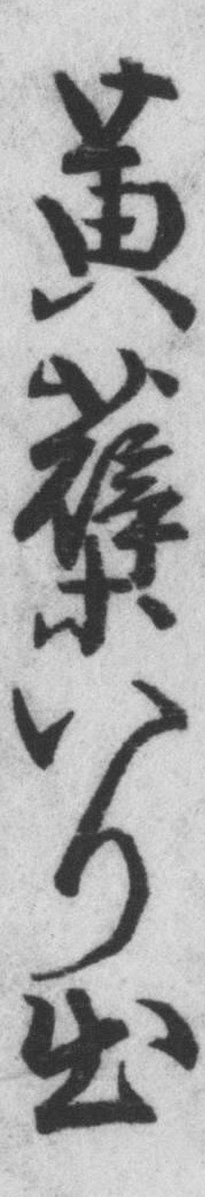黄檗いり出
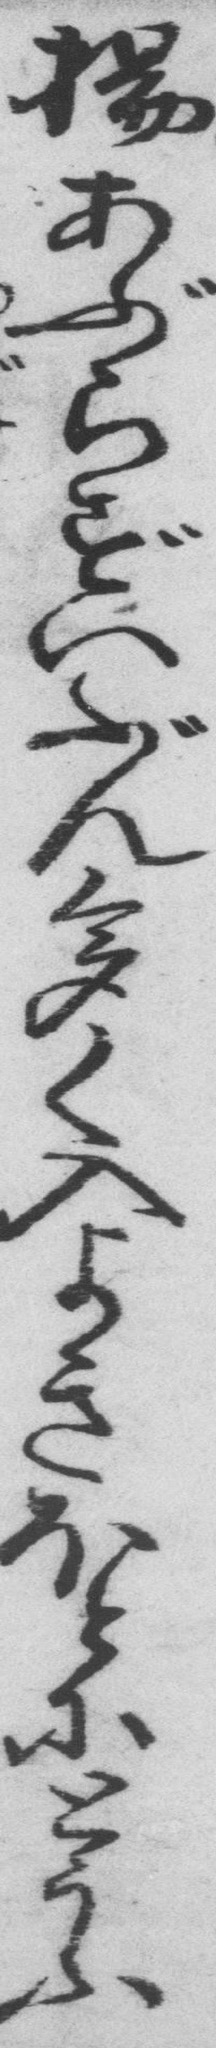揚あぶらずいぶん多く入よきほとにとうふ
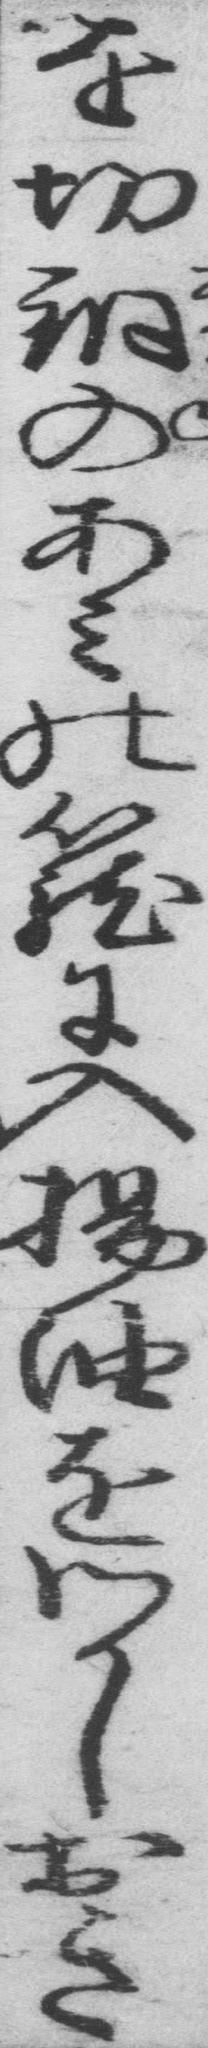を切銅のあみの籠に入揚油をわかしおき
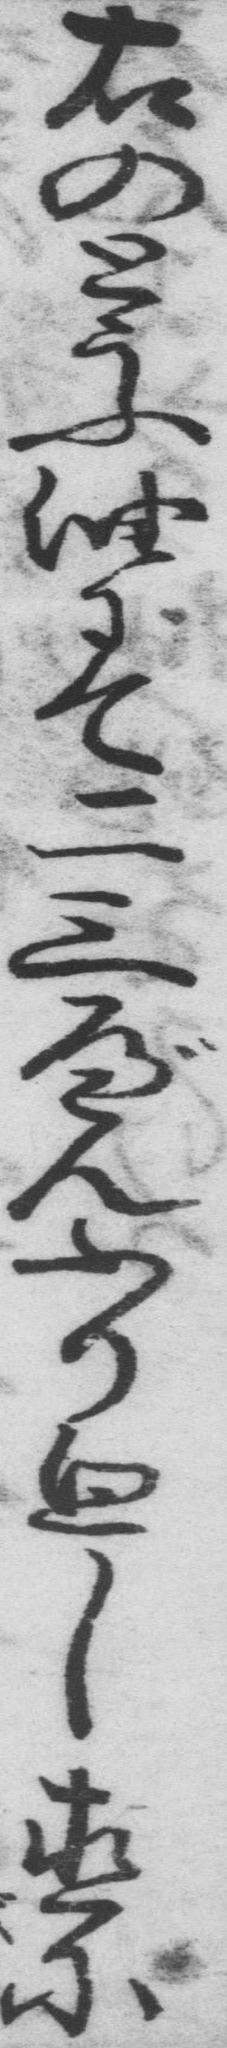右のとうふ油にて二三べんふり廻し直に
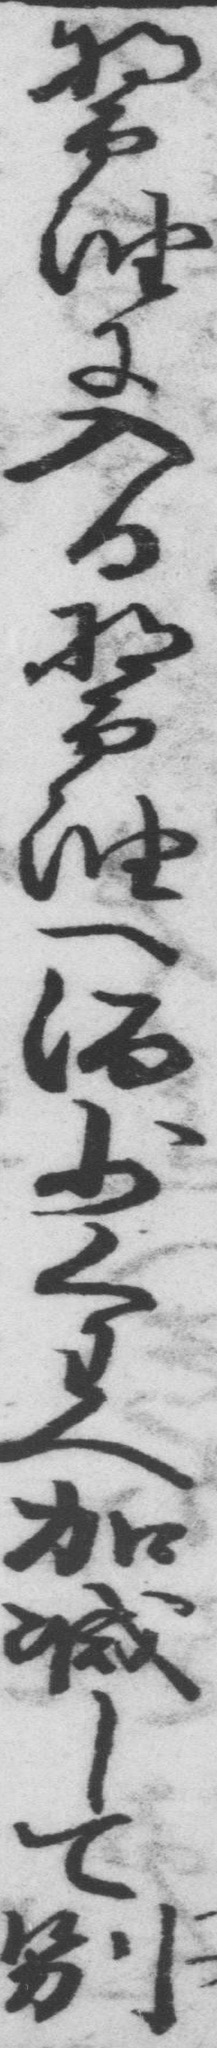醤油に入る醤油へ酒少くわへ加減して別
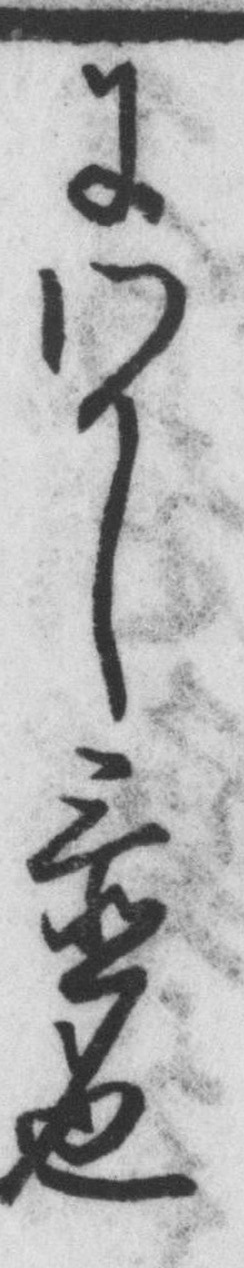にいたし置也
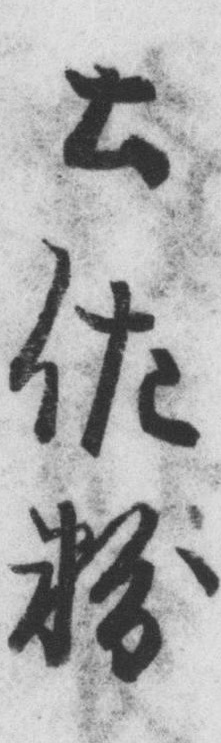土佐粉
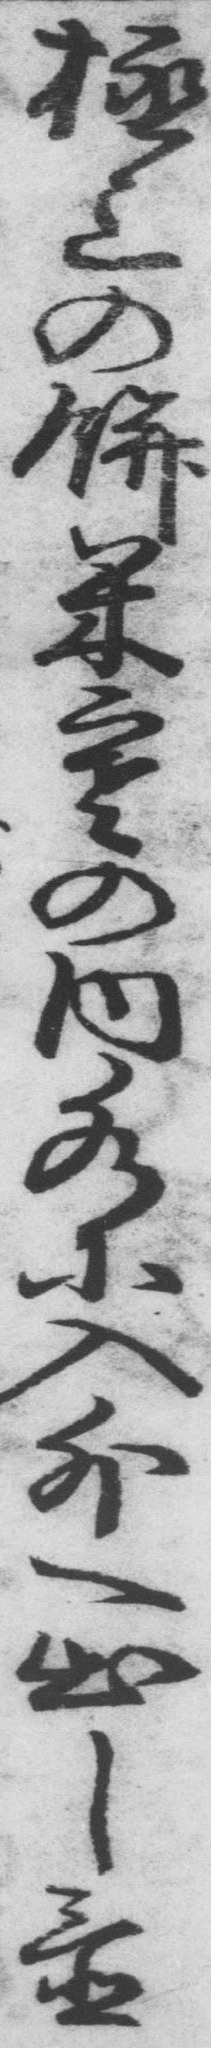極上の餅米寒の内水に入外へ出し置
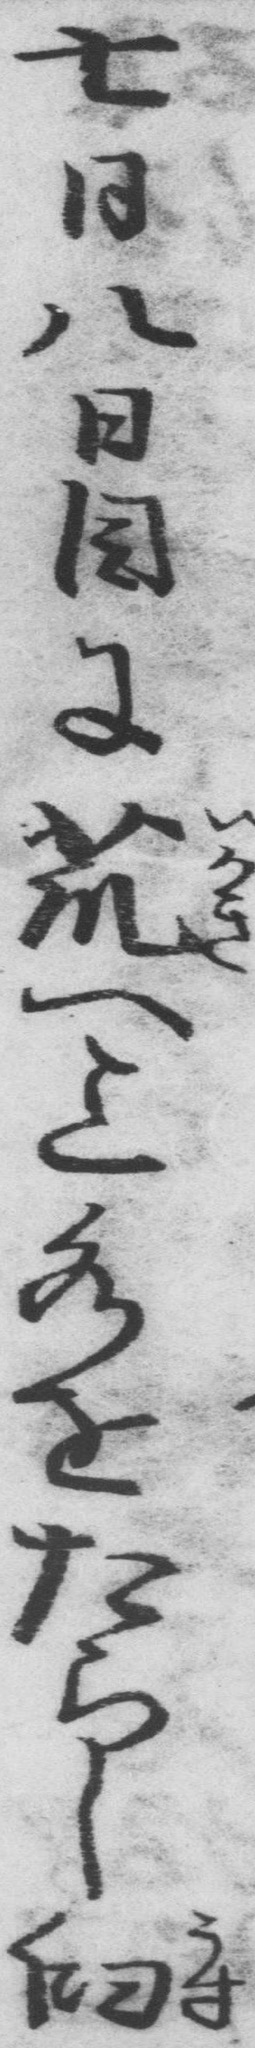七日八日目に笊へ上水をたらし臼
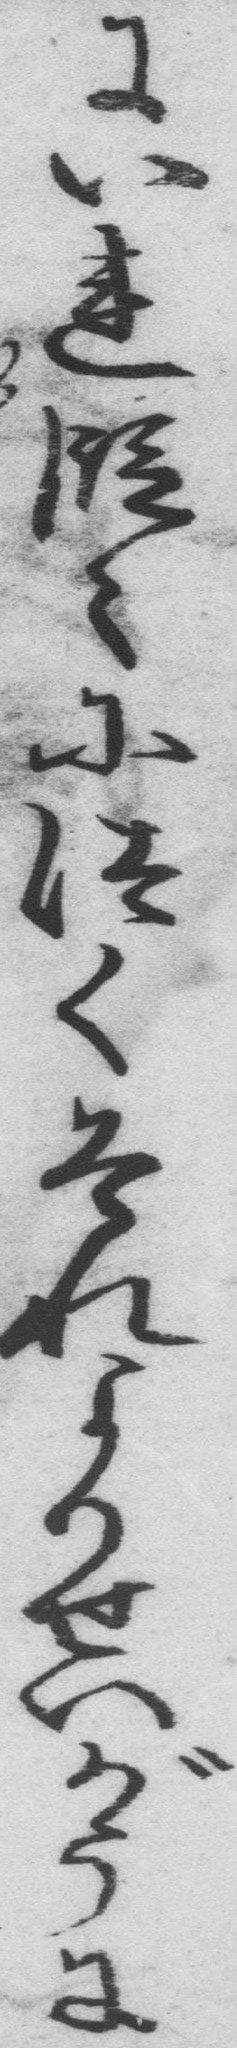にいれ段々につくそれよりせいがうに
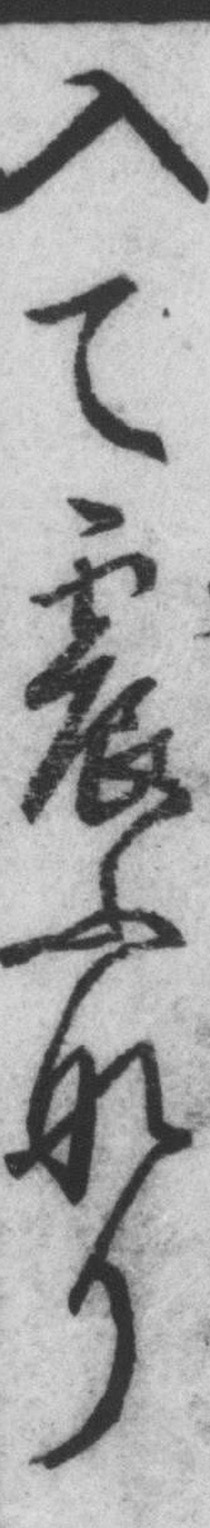入て震ふなり

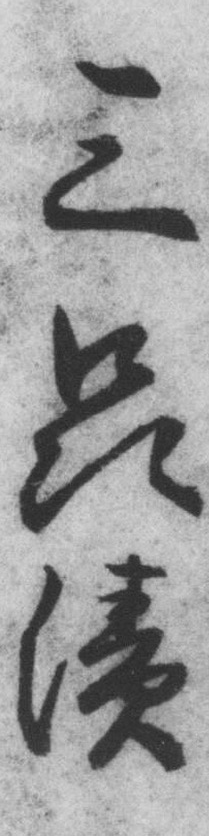三品漬
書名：料理山海郷
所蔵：大阪府立大学学術情報センター 国文学研究資料館
